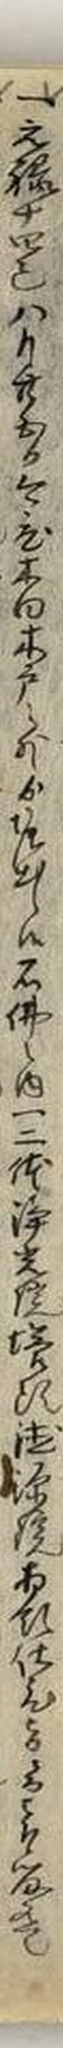一元禄十四巳八月廿五日今度木田木戸之外ゟ掘出し候石仏之内一二体浄光院塔頭徳源院拝領仕度旨にて被下候留有之
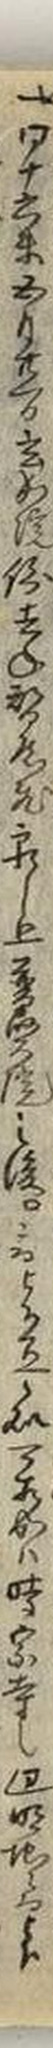一同十六未五月廿一日玄成院儀去年替屋敷願之上普賢院之後口にて被下置候処可相成は時宗寺之辺明地にて被下
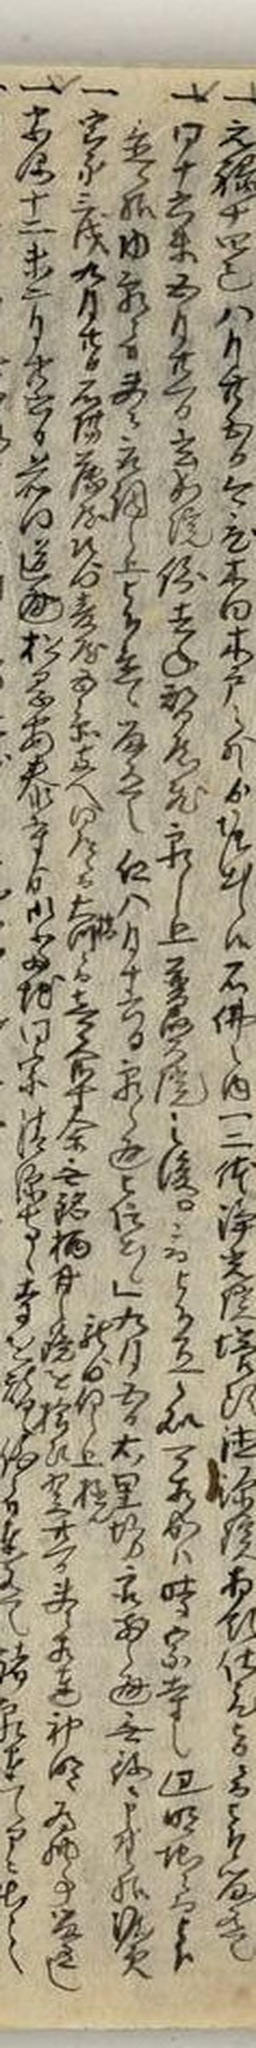置候様内願に付夫々取調之上被下置候留有之但八月十六日願之通被仰出候」九月五日右里坊最前之通無役被申付候様渥美
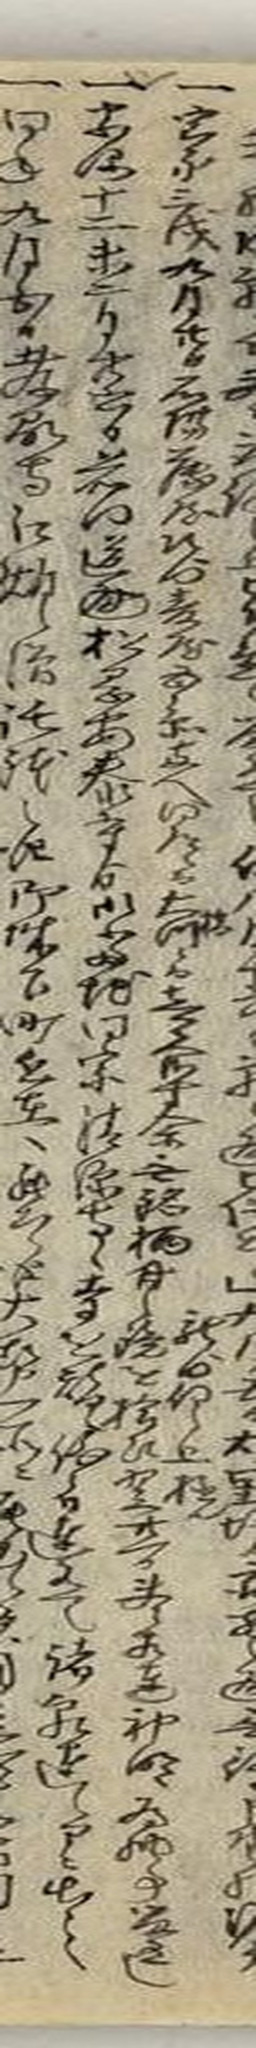一同年九月五日孝顕寺江湖之僧托鉢之儀御城下町近在へ罷出候儀大勢一所に罷出候ては目立可申候間目立
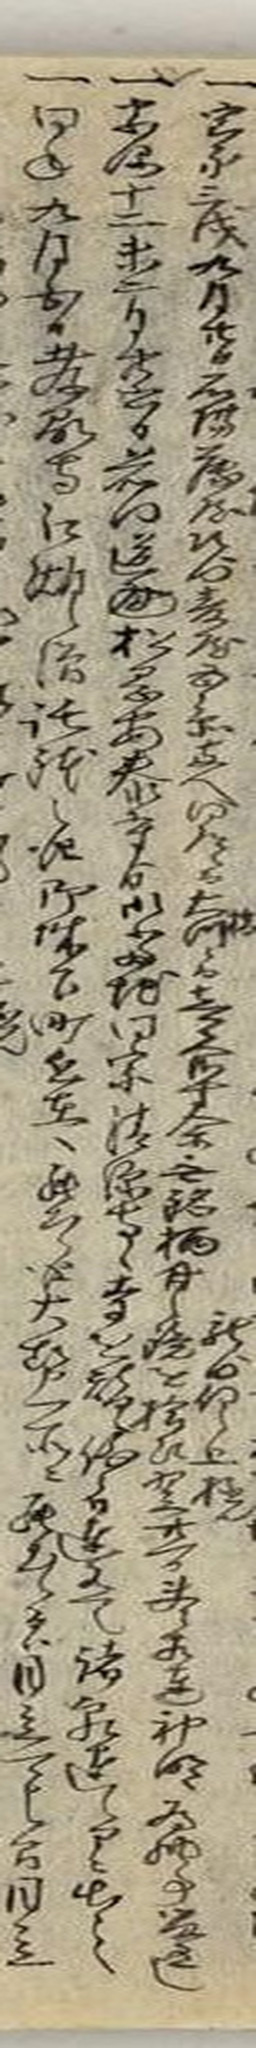一同年九月五日孝顕寺江湖之僧托鉢之儀御城下町近在へ罷出候儀大勢一所に罷出候ては目立可申候間目立
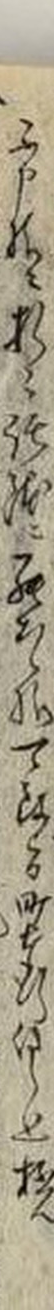不申様に折々托鉢に罷出候様可致旨町奉行伺之上極ル
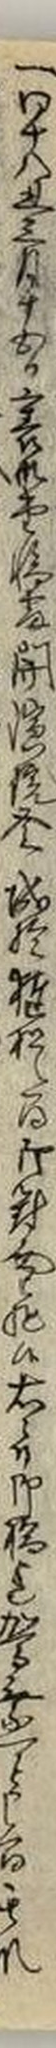一同十八丑三月十五日裏御堂輪番開演院登城於韃靼之間御対面被遊候右に付御橋迄駕乗可被申候間其段
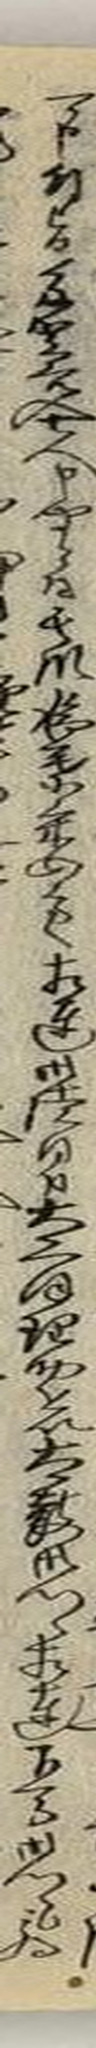可申付旨多賀谷舎人申聞候付其段稲葉采女方へ相達御徒目付大久保理助を以太皷御門へ相達下馬御門へも為
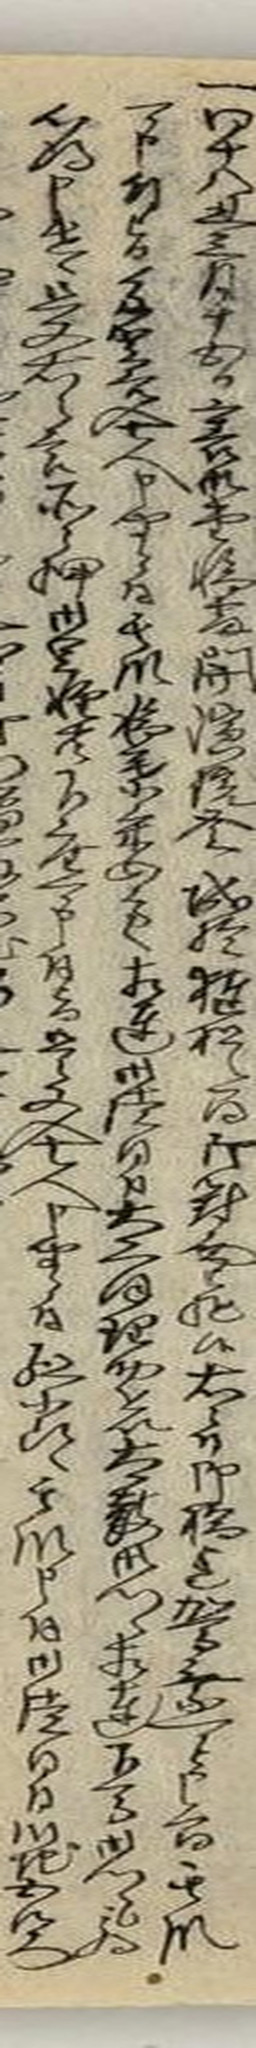心得申遣候且又右之節所々押御足軽共下座可申付旨是又舎人申聞候に付組小頭へ其段申付御徒目付川地五左衛門
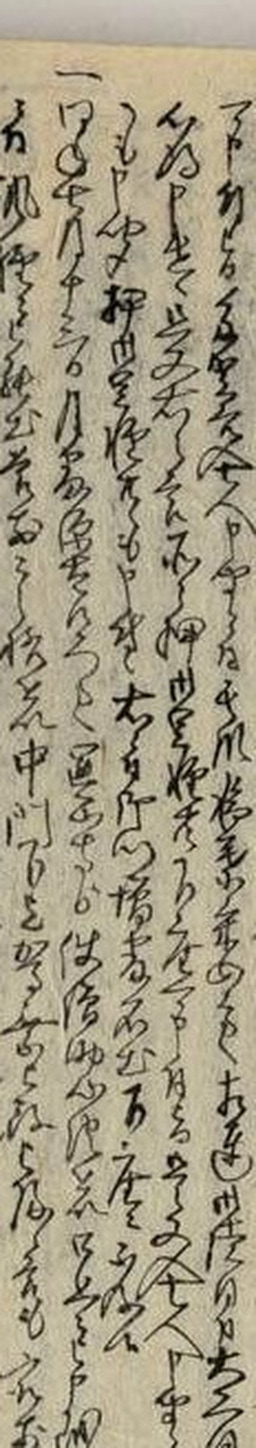へも申聞押御足軽共へも申付候右に付御門増番不出下座に不及候
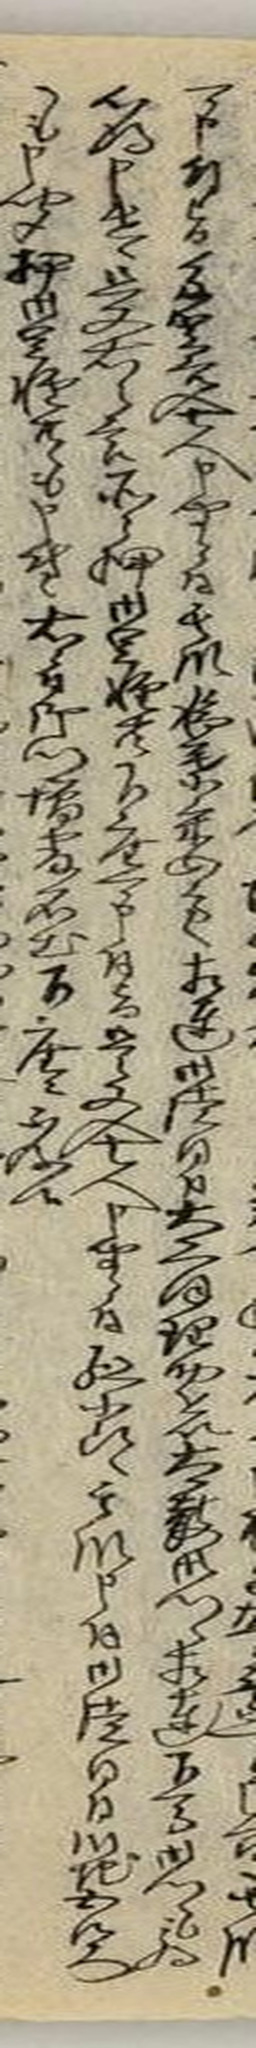へも申聞押御足軽共へも申付候右に付御門増番不出下座に不及候
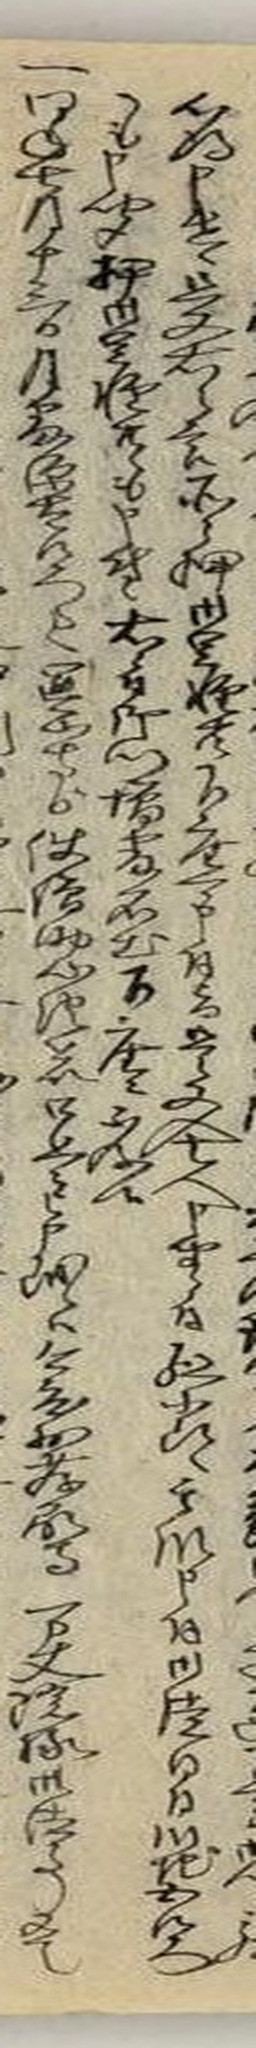一同年七月十三日月番源太左衛門方へ運正寺ゟ使僧助心院を以口上に被申越候は今度於孝顕寺万丈院様御法事有之
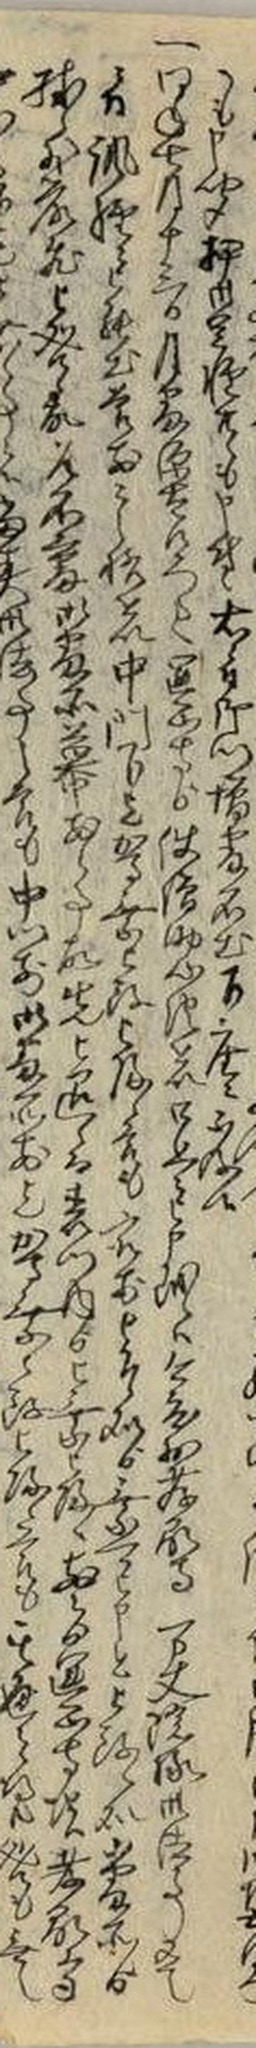に付諷経に被罷出節前々之格を以中門下迄駕乗被致被帰候節も最前被下候処ゟ乗可被申と被致候処御番所ゟ
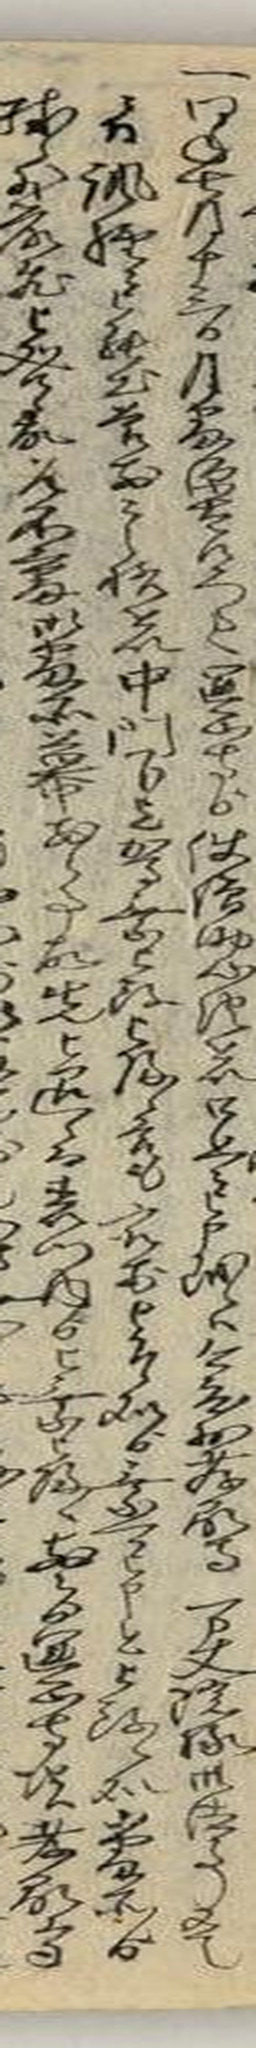殊之外厳敷被咎候故乍不審御番所幕前之事故先被退候て表門内ゟ被乗被帰候前々ゟ運正寺儀は孝顕寺
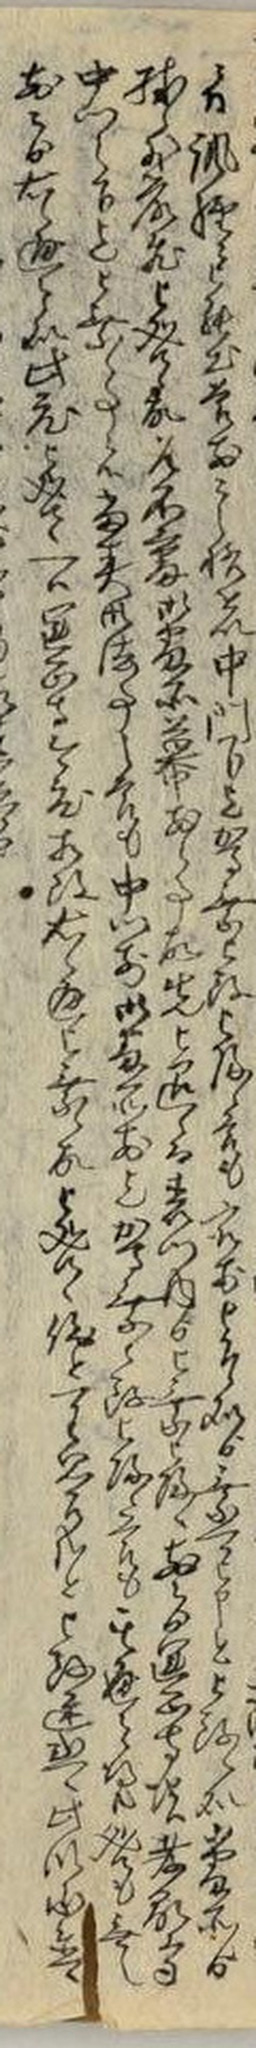中門之下迄被乗候事に候当春御法事之節も中門前御番所前迄駕乗被致被帰候節も其通に候得共咎も無之
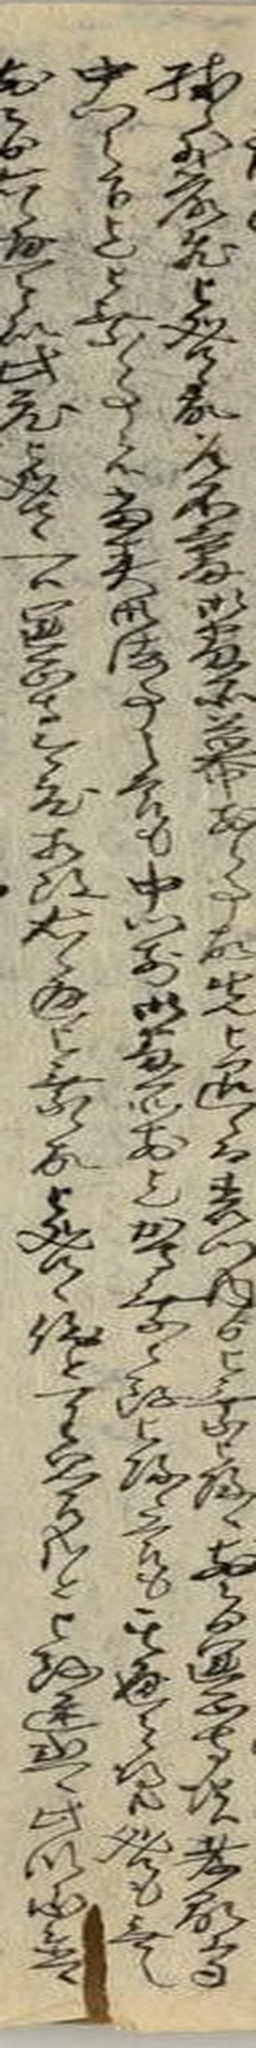前々ゟ右之通に候処此度被咎候へは運正寺今度相改右之通被乗候故被咎候儀と可被思召哉と被致迷惑候此段承置候
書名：御城下諸事之部
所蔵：福井県文書館 Fukui Prefectural Archives
